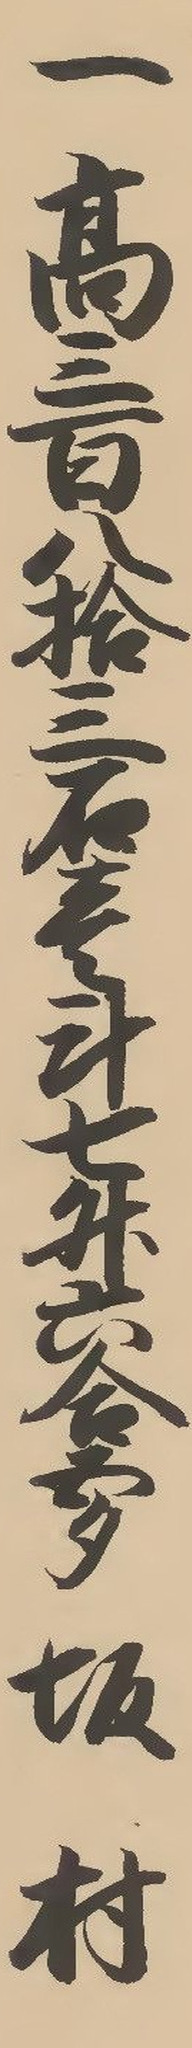一高三百八拾三石壱斗七升六合五勺坂村
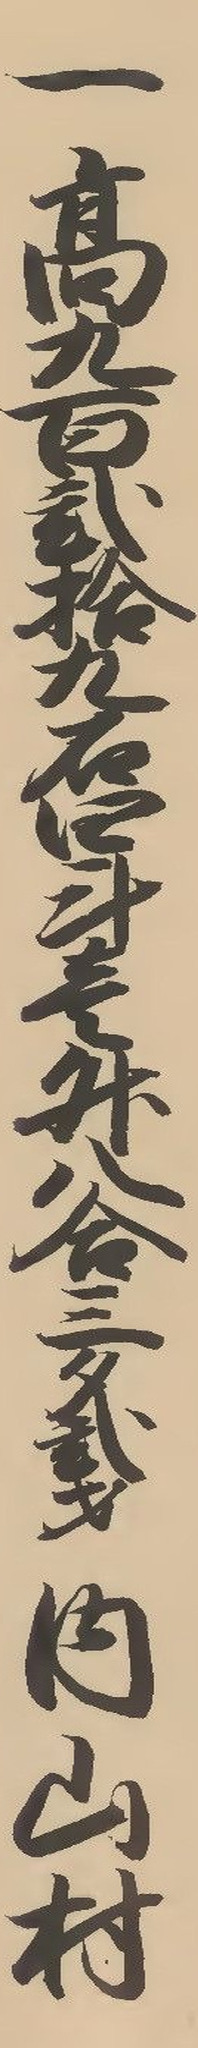一高九百弐拾九石四斗壱升八合三勺弐才内山村
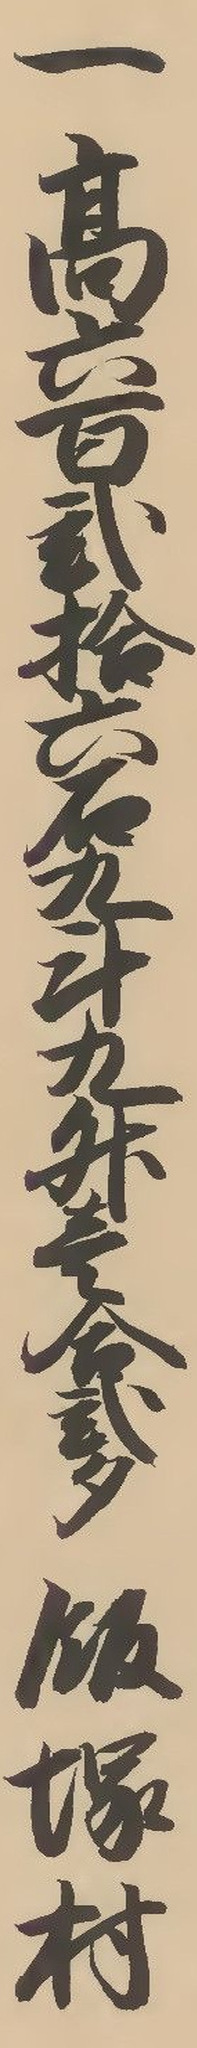一高六百弐拾六石九斗九升壱合弐勺飯塚村

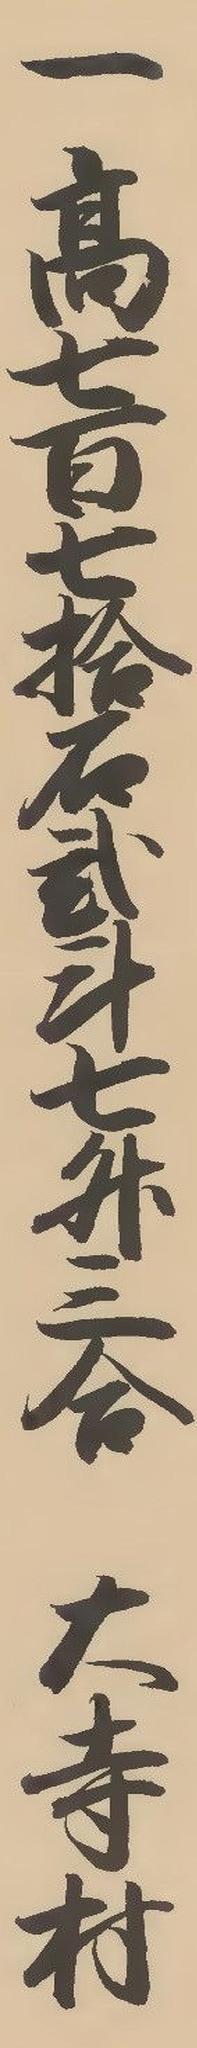一高七百七拾石弐斗七升三合大寺村
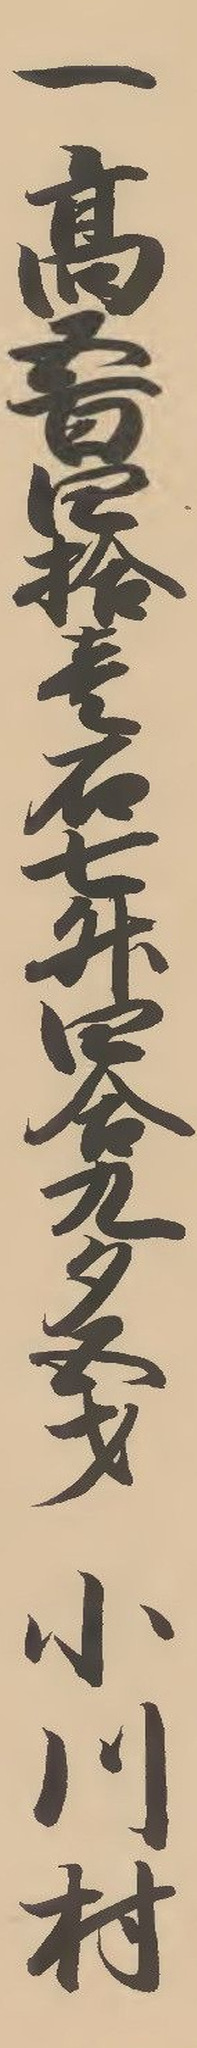一高五百四拾壱石七升四合九勺五才小川村
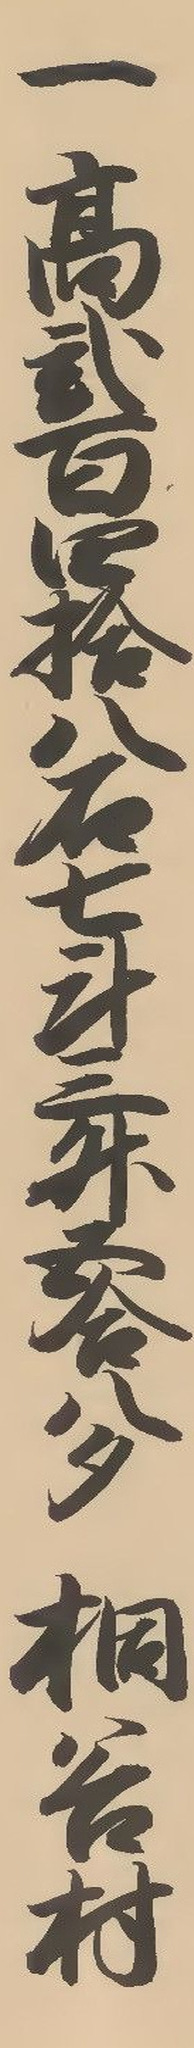一高弐百四拾八石七斗三升五合八勺桐谷村
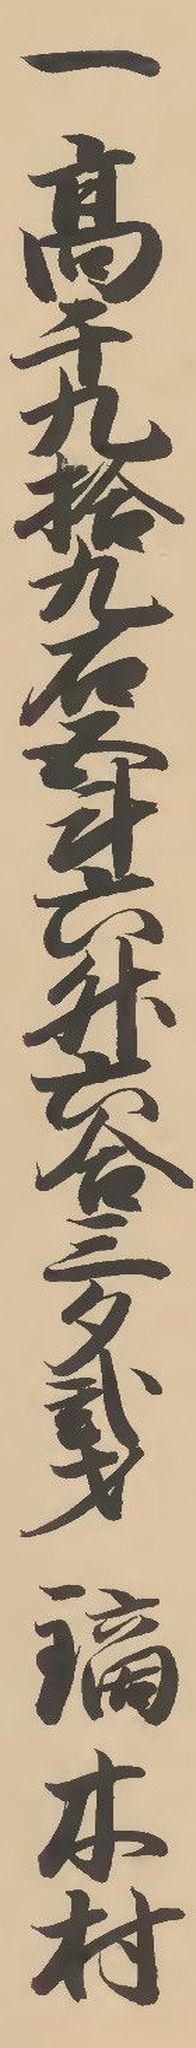一高千九拾九石五斗六升六合三勺弐才鏑木村
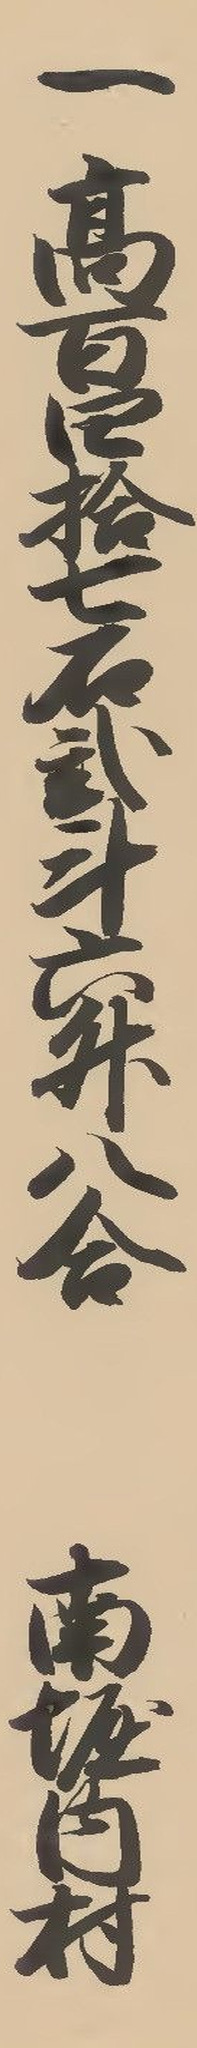一高百四拾七石弐斗六升八合南堀内村
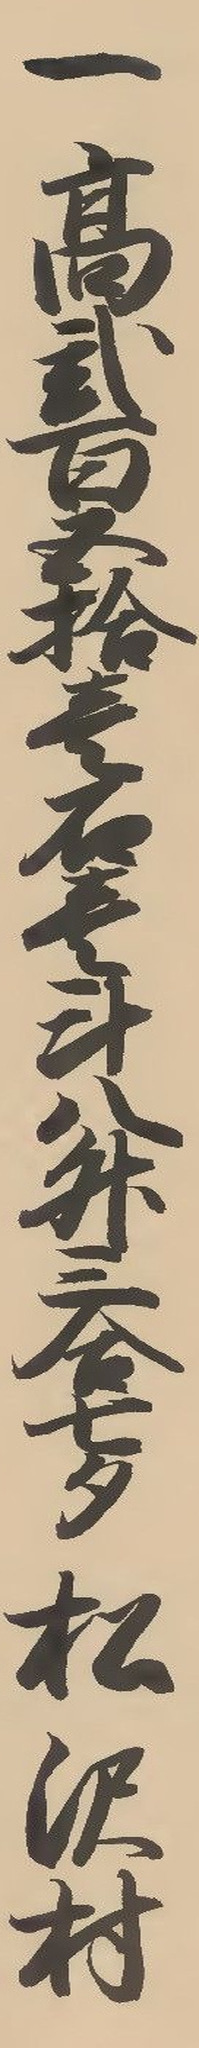一高弐百五拾壱石壱斗八升三合七勺松沢村
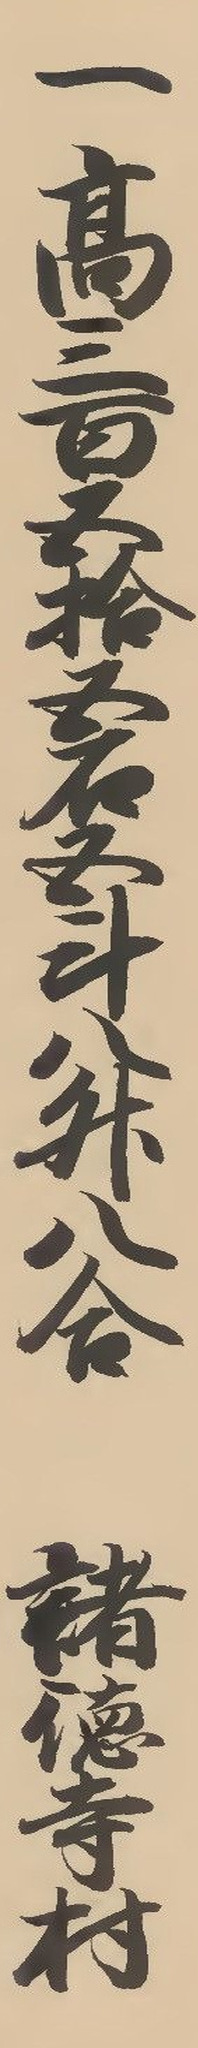一高三百五拾五石五斗八升八合諸徳寺村
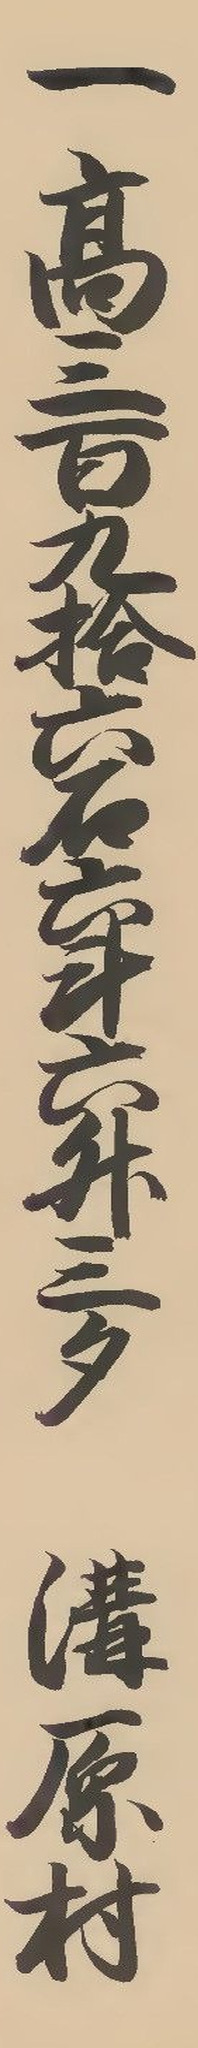一高三百九拾六石六斗六升三勺溝原村

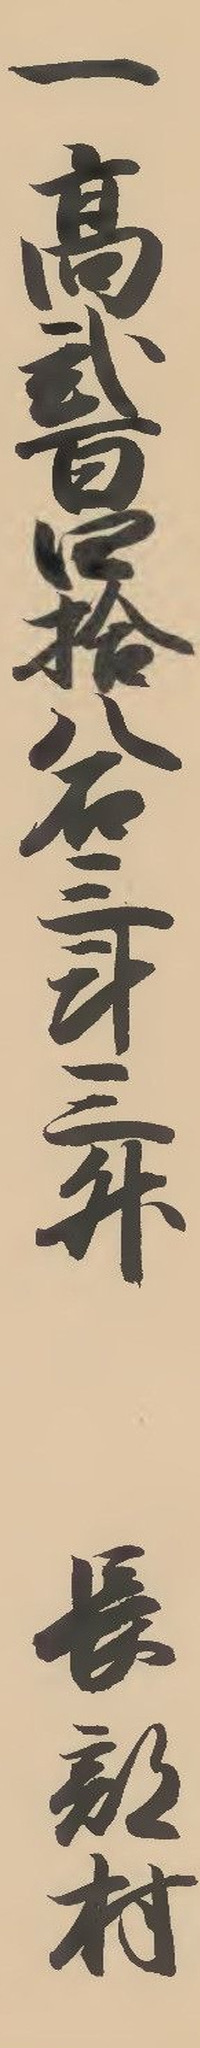一高弐百四拾八石三斗三升長部村
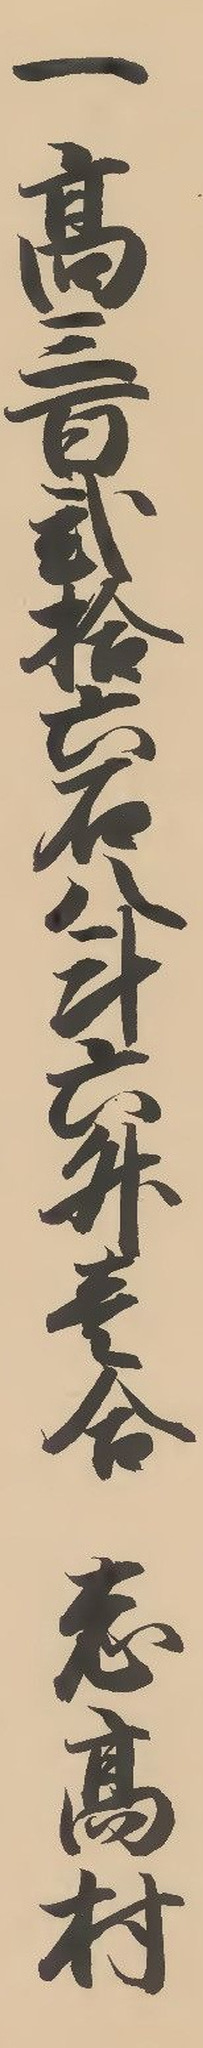一高三百弐拾六石八斗六升壱合志高村
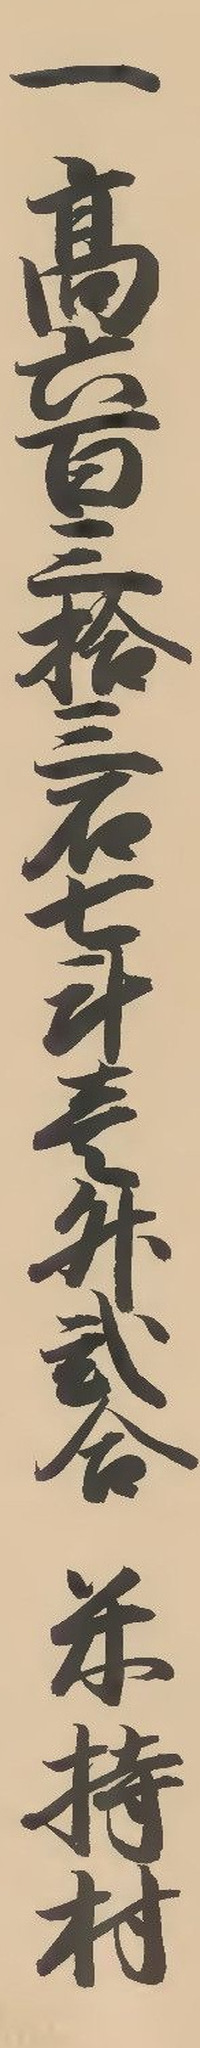一高六百三拾三石七斗壱升弐合米持村
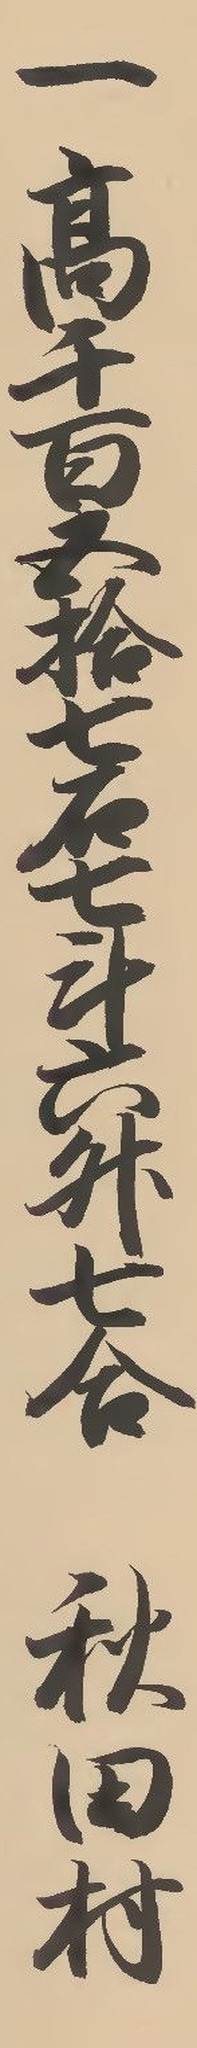一高千百五拾七石七斗六升七合秋田村
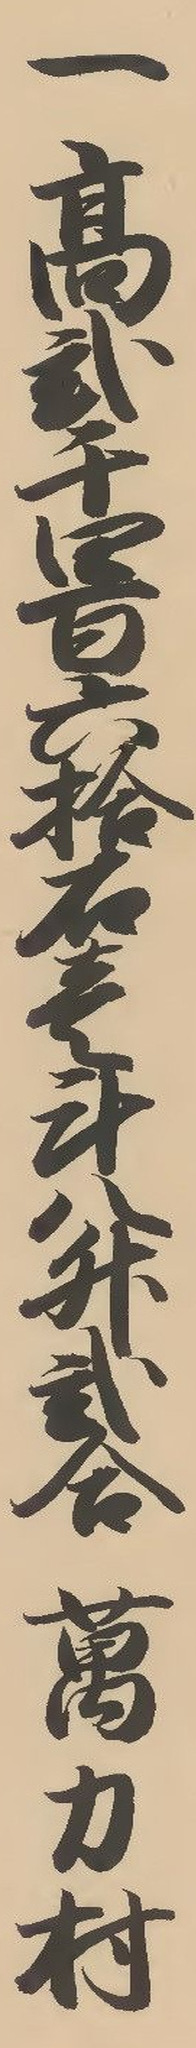一高弐千四百六拾石壱斗八升弐合万力村
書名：下総国郷帳
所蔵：国立公文書館 National Archives of Japan
